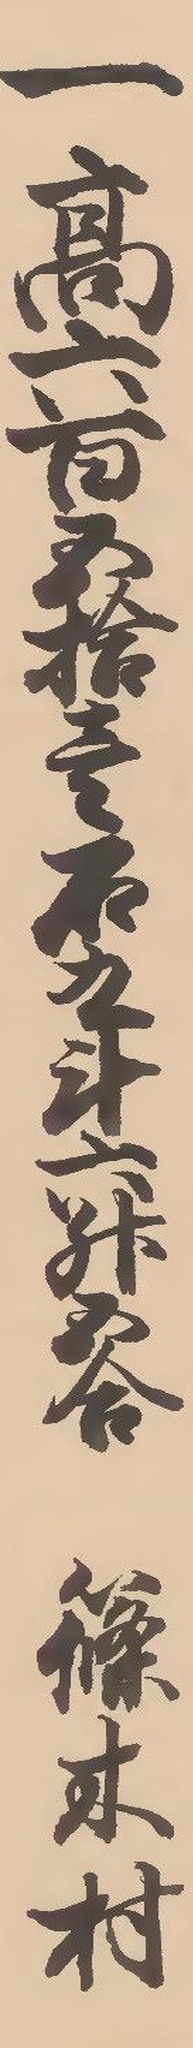一高六百五拾壱石九斗六升五合篠木村

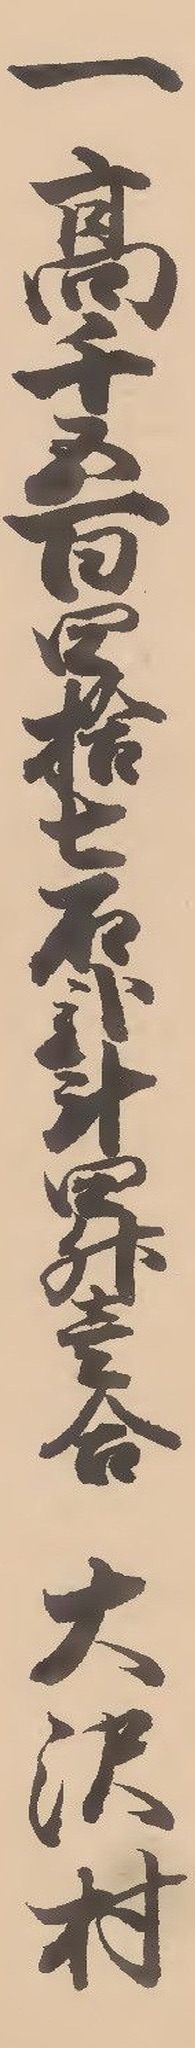一高千五百四拾七石弐斗四升壱合大沢村
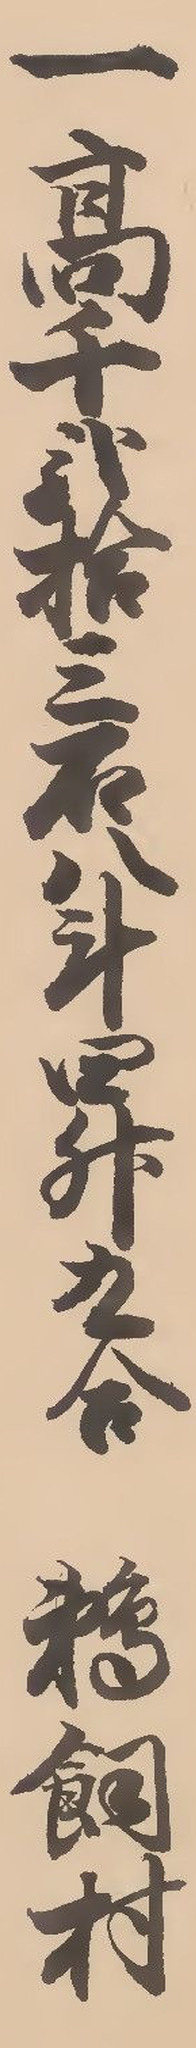一高千弐拾三石八斗四升九合鵜飼村
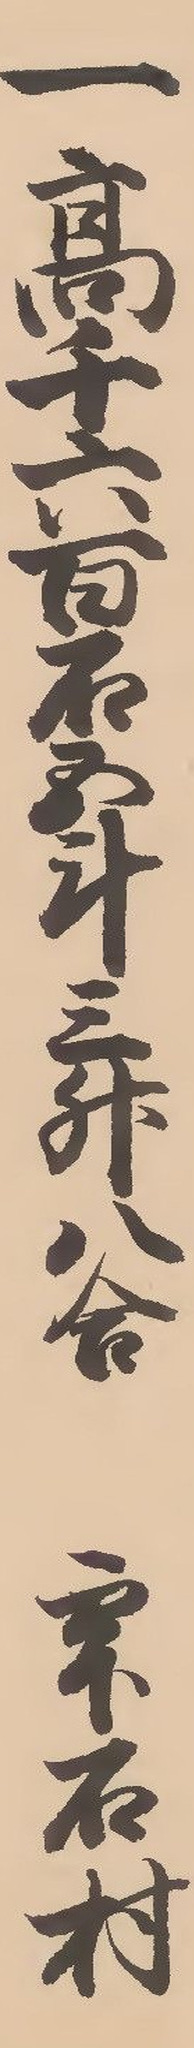一高千六百石五斗三升八合雫石村
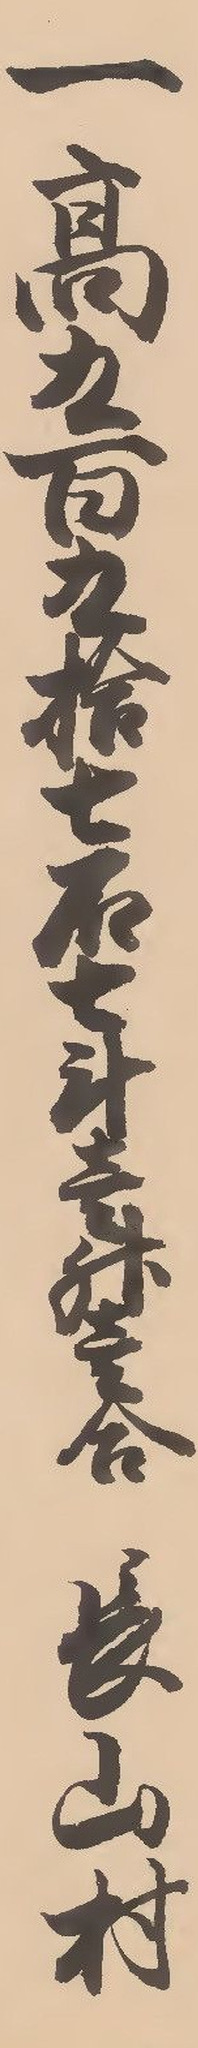一高九百九拾七石七斗壱升壱合長山村
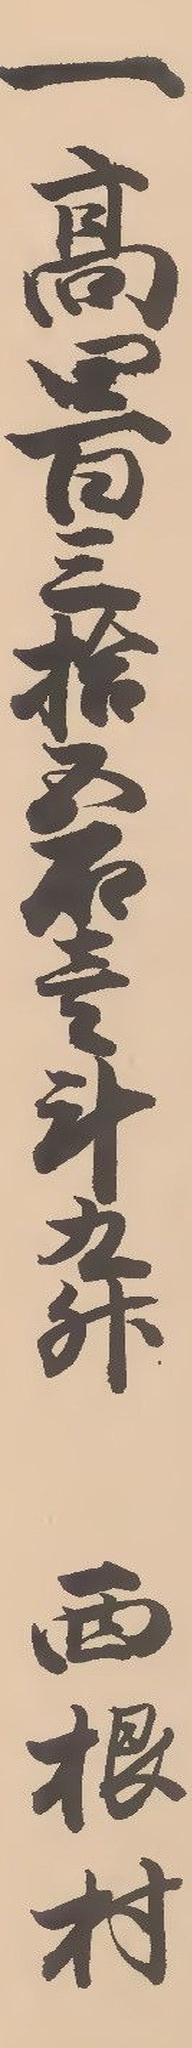一高四百三拾五石壱斗九升西根村
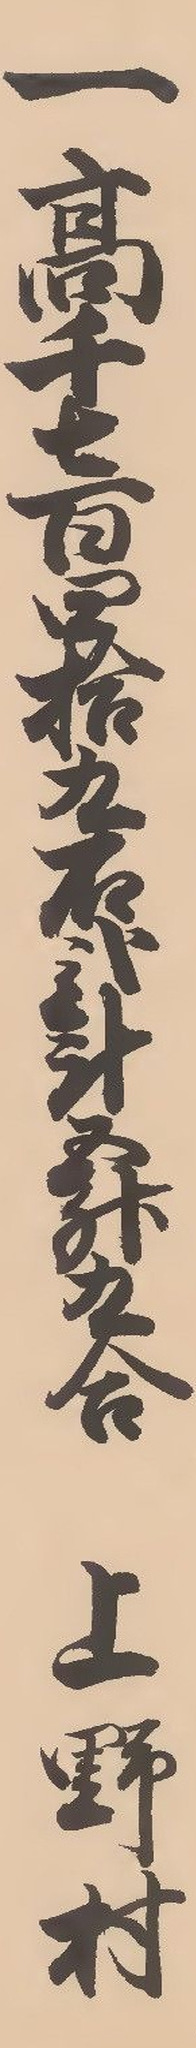一高千七百四拾九石弐斗五升九合上野村
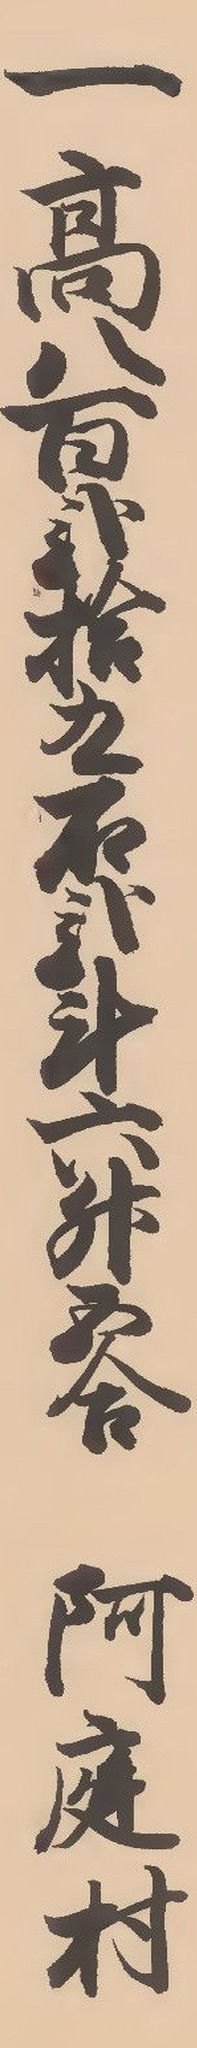一高八百弐拾九石弐斗六升五合阿庭村
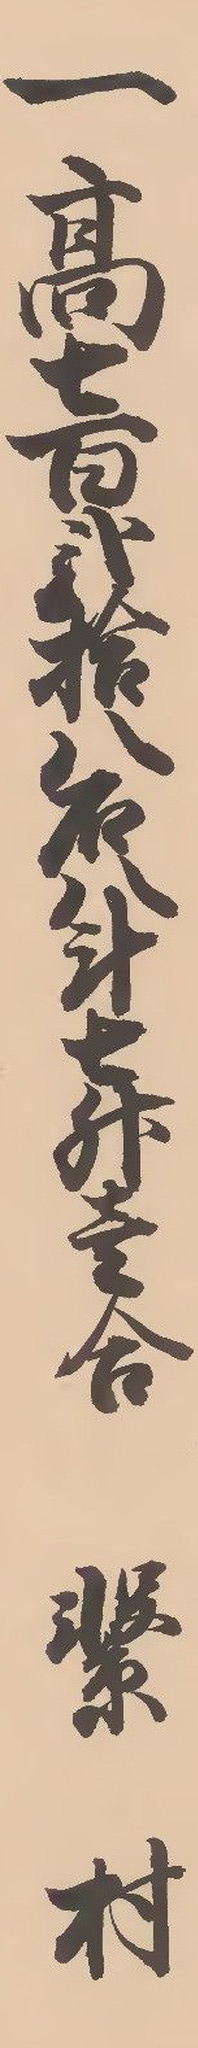一高七百弐拾八石八斗七升壱合繋村

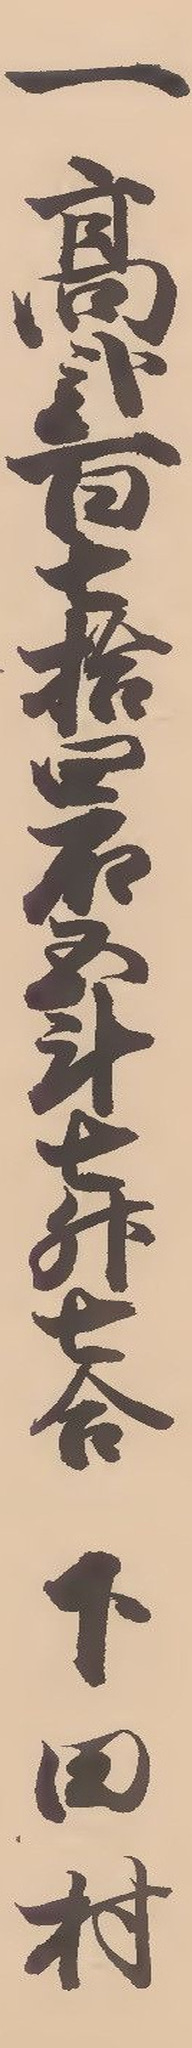一高弐百七拾四石五斗七升七合下田村
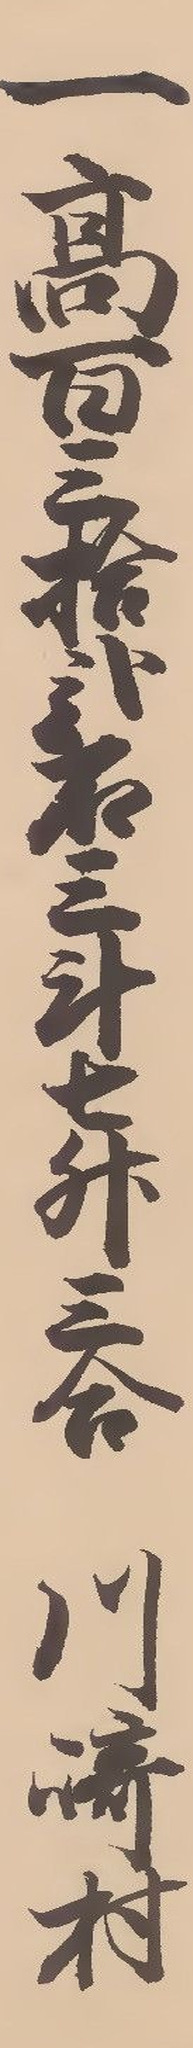一高百三拾弐石三斗七升三合川崎村
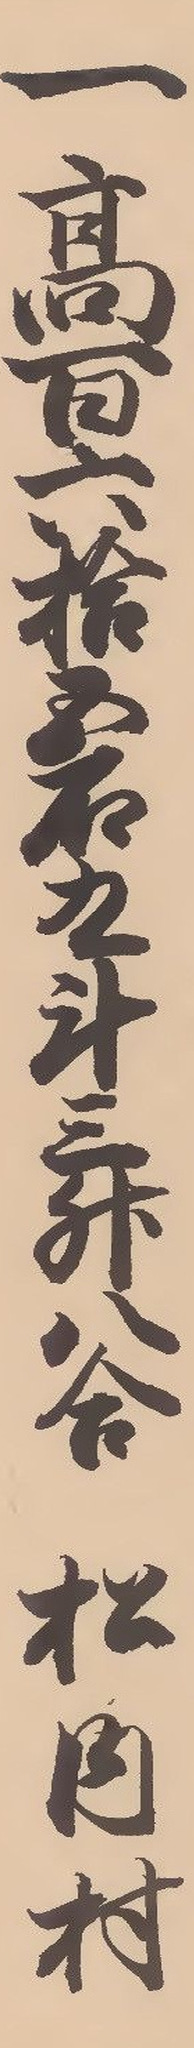一高百六拾五石九斗三升八合松内村
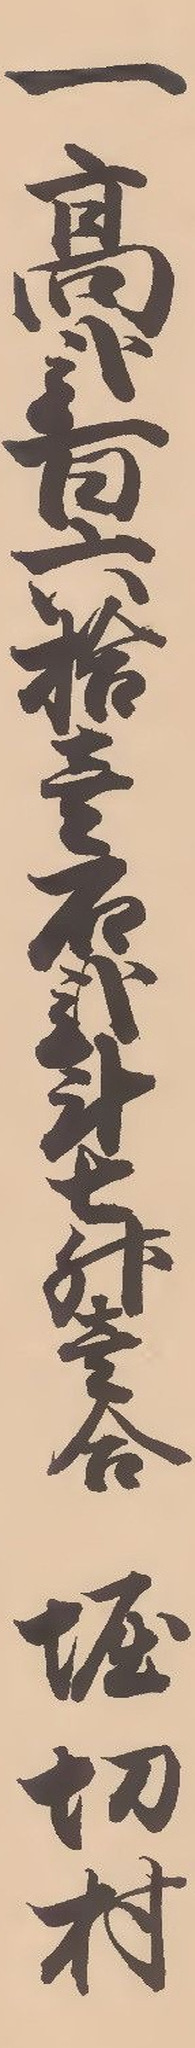一高弐百六拾壱石弐斗七升壱合堀切村
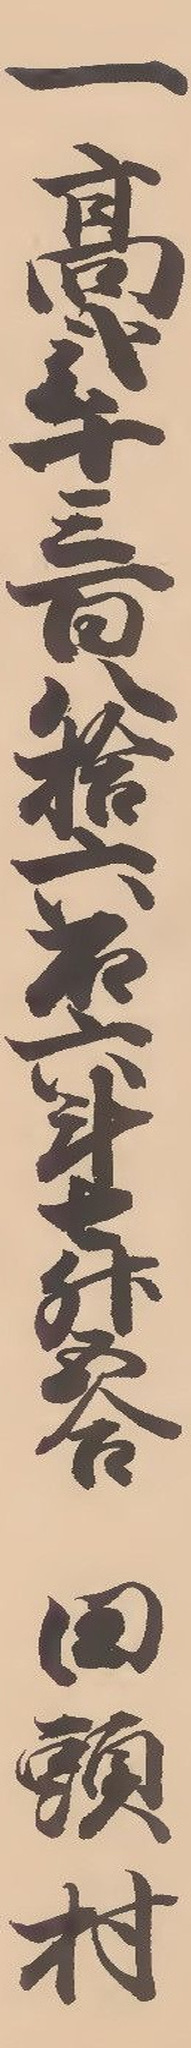一高弐千三百八拾六石六斗七升五合田頭村
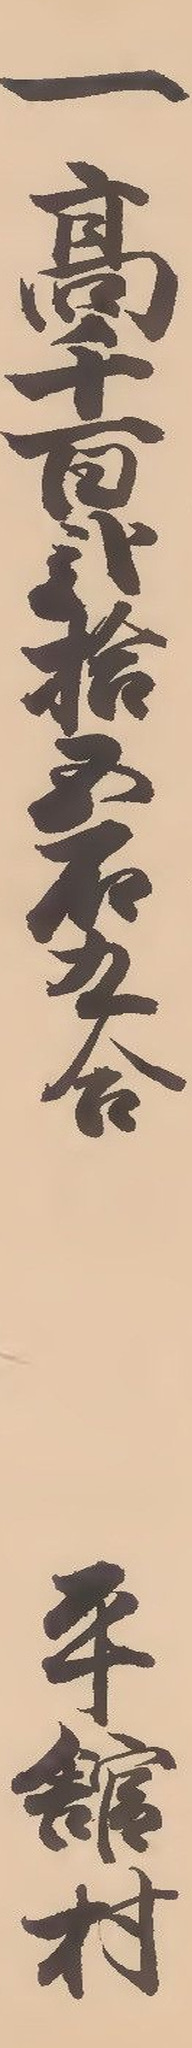一高千百弐拾五石九合平舘村
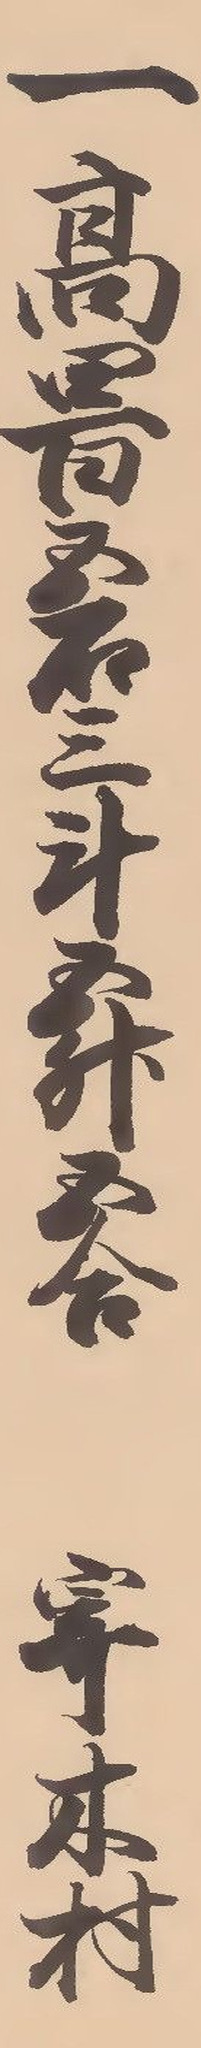一高四百五石三斗五升五合寄木村
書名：陸奥国郷帳　６
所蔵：国立公文書館 National Archives of Japan
